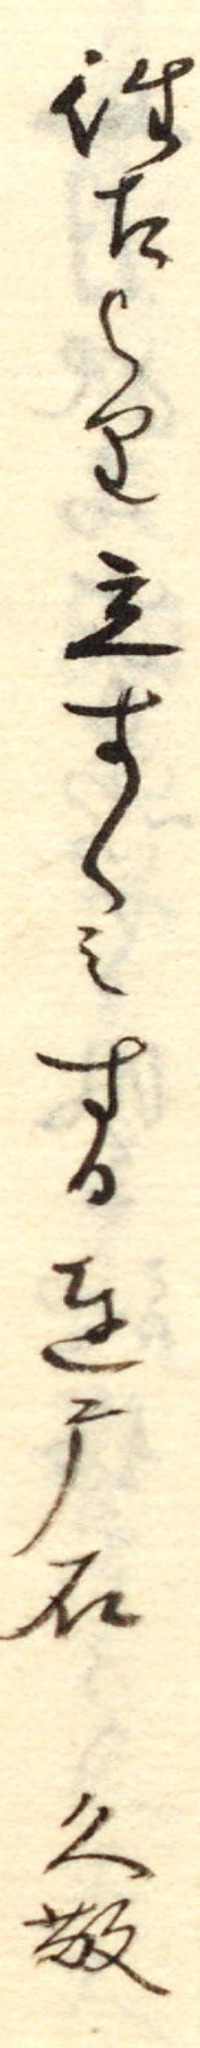往古より立すくみする達磨石久敬
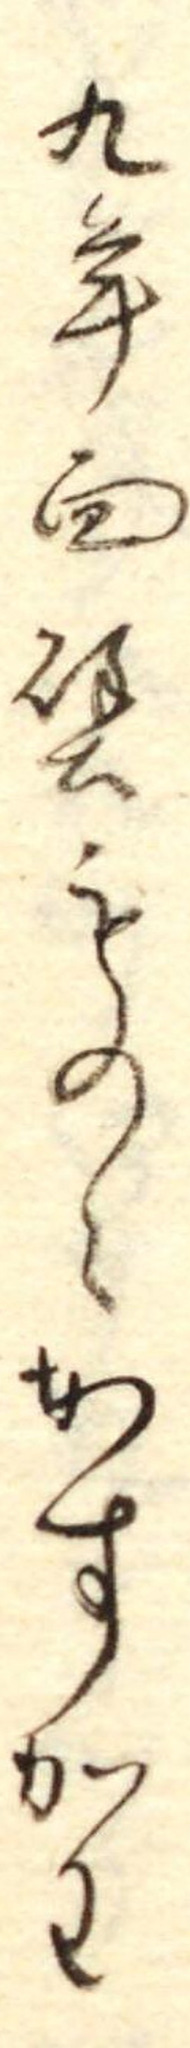九年白壁ものゝわすかわ
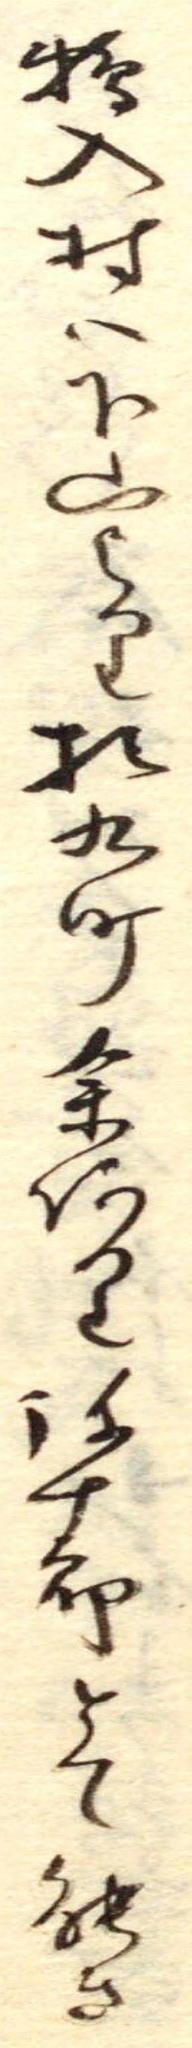鵜入村は下山より拾九町余あり弥十郎とて能き
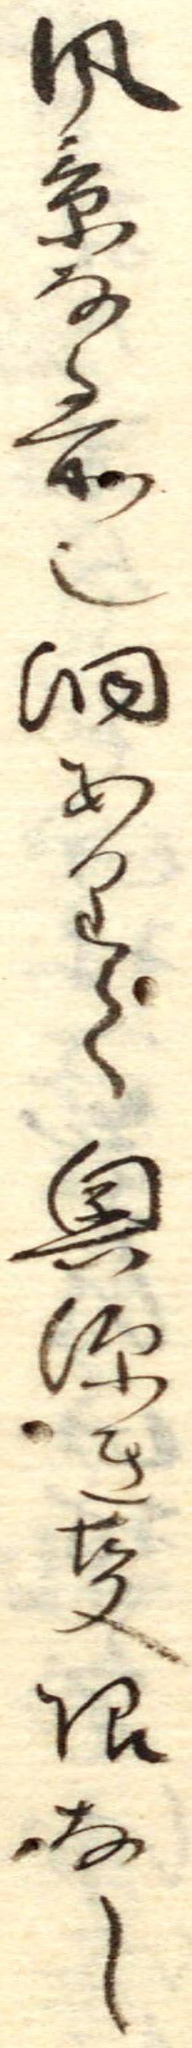風景なる所也洞ありて奥深き事限なし
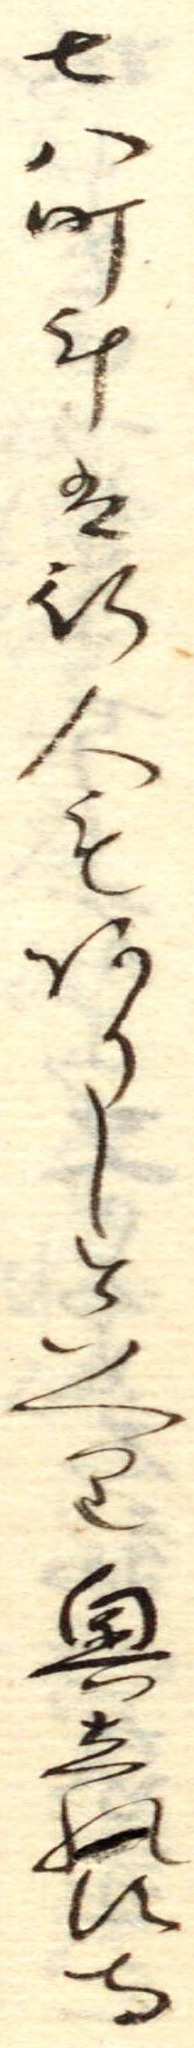七八町計は行人もありしといへり奥しれす寺
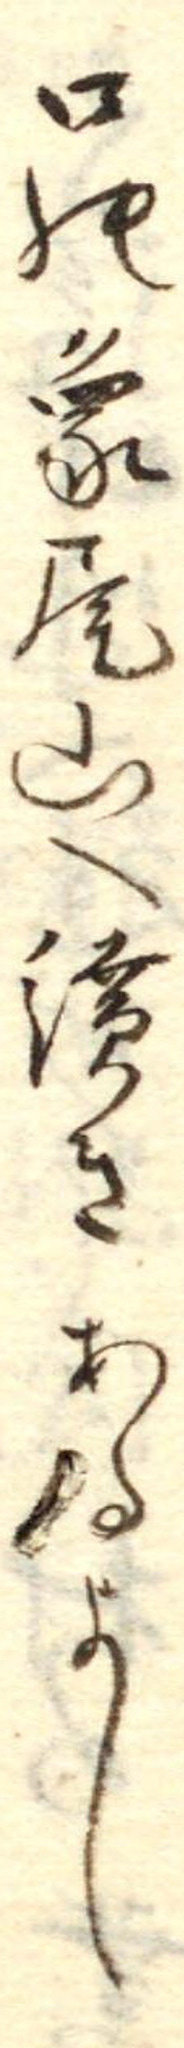口の象尾山へ続きあるよし
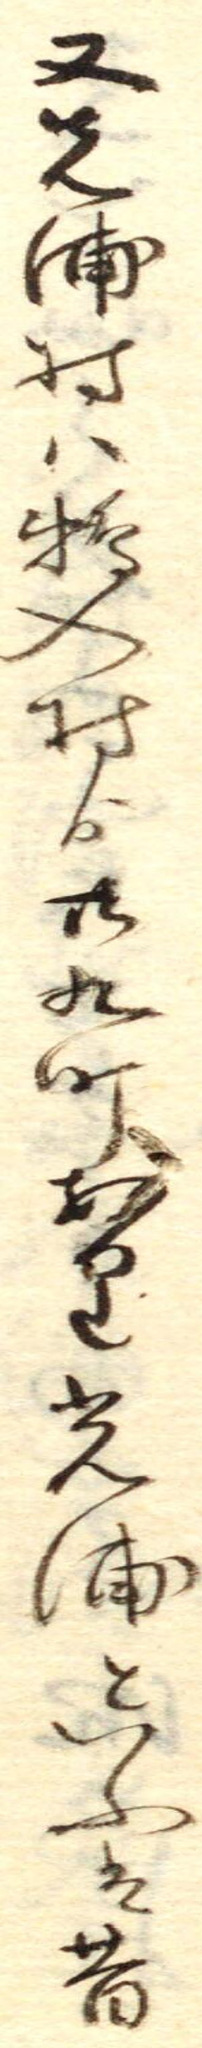又光浦村は鵜入村ゟ廿九町あり光浦といふは昔
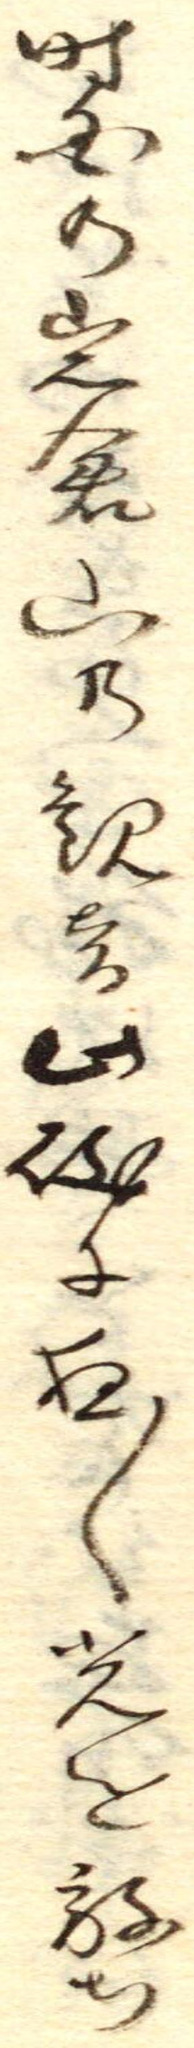時国の岩倉山の観音此礒に夜々光を放ち
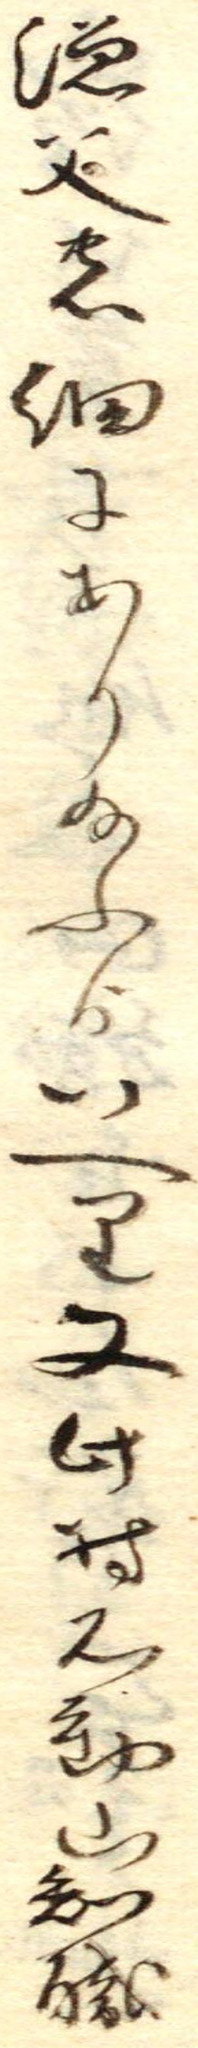漁父の細にあり給ふゟいへり又此村石動山知職
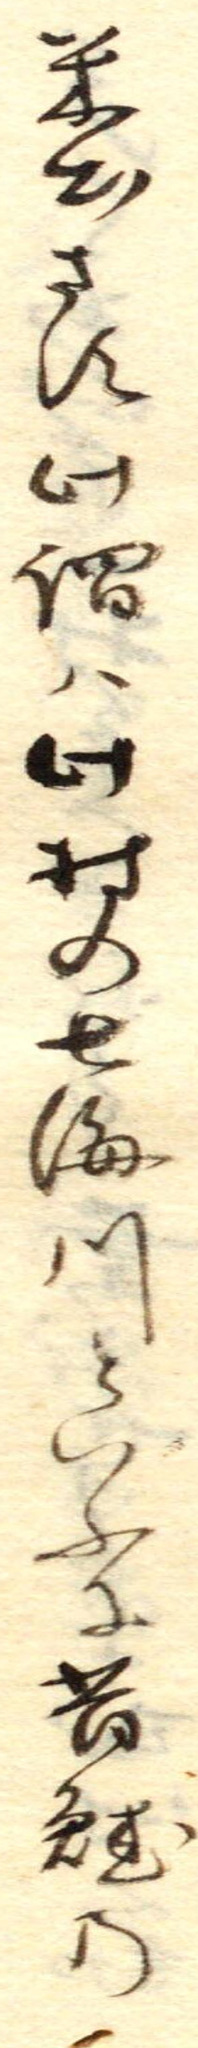米出さす此謂は此村の七海川といふに昔鮭の

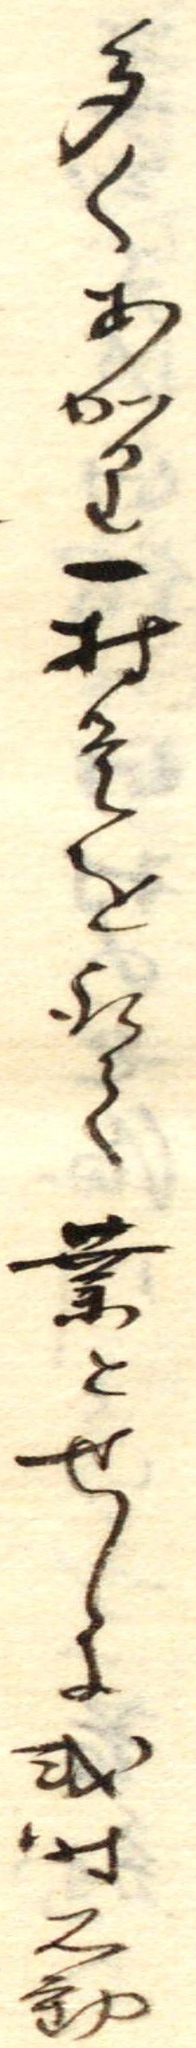多くあかり一村是を取て生業とせしに或時石動
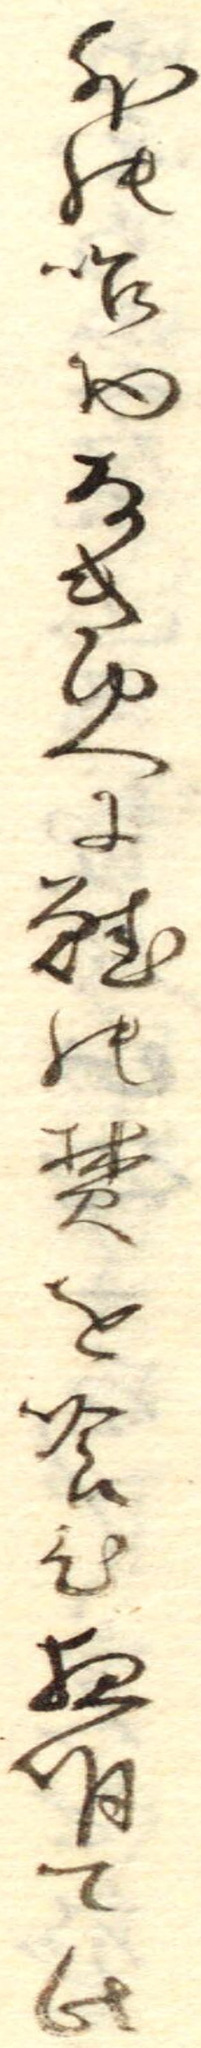外の咋物なきゆへに鮭の焚を喰ひ夜明て此
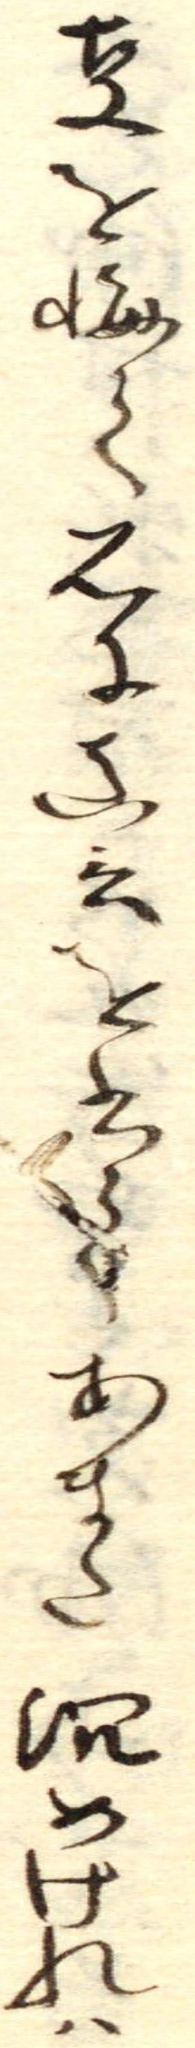事を悔て石に真言を書てあまた沈めけれは
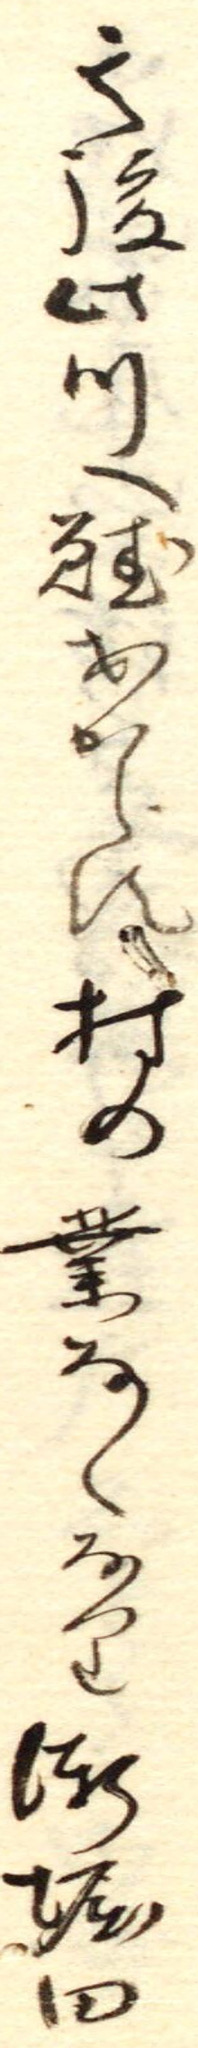其後此川へ鮭あからす村の業なくなり漸堀田
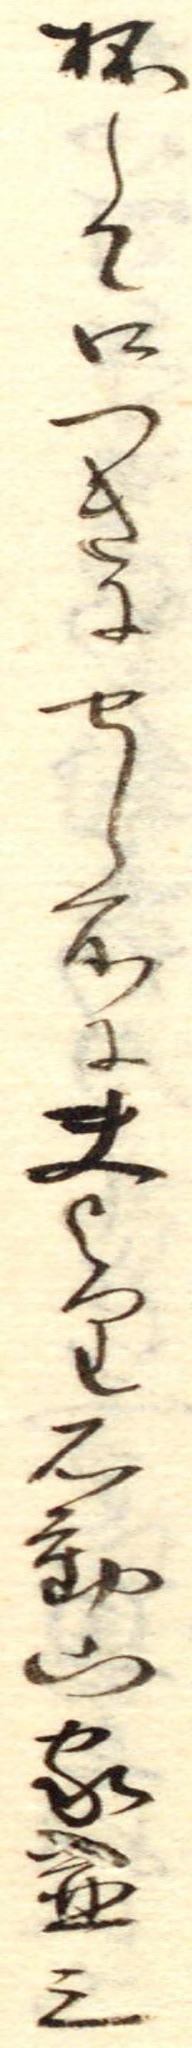抔して口つきにせし所夫より石動山家並三
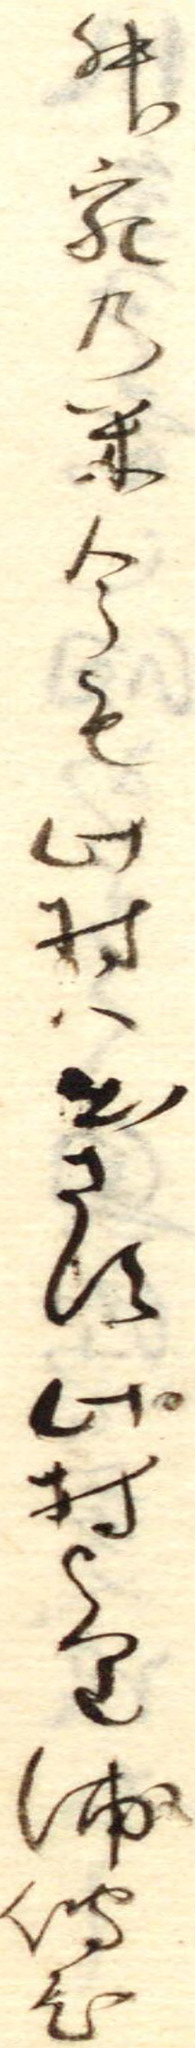桝宛の米今も此村は出さす此村より浦伝ひ
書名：能登名跡誌
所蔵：Ishikawa Prefectural Library
